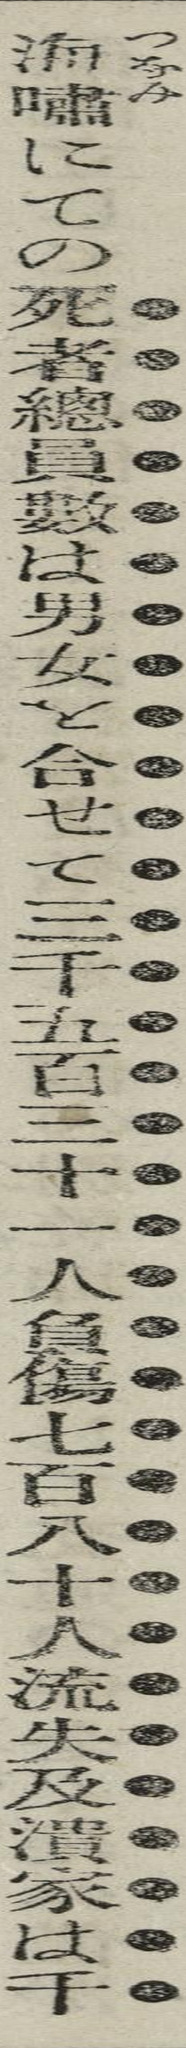海嘯にての死者總員數は男女を合せて三千五百三十一人負傷七百八十人流失及潰家は千
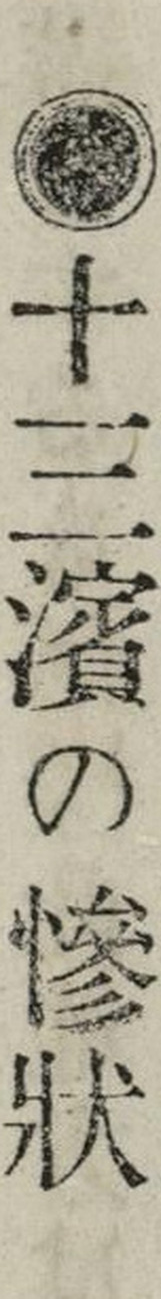●十三濱の惨狀
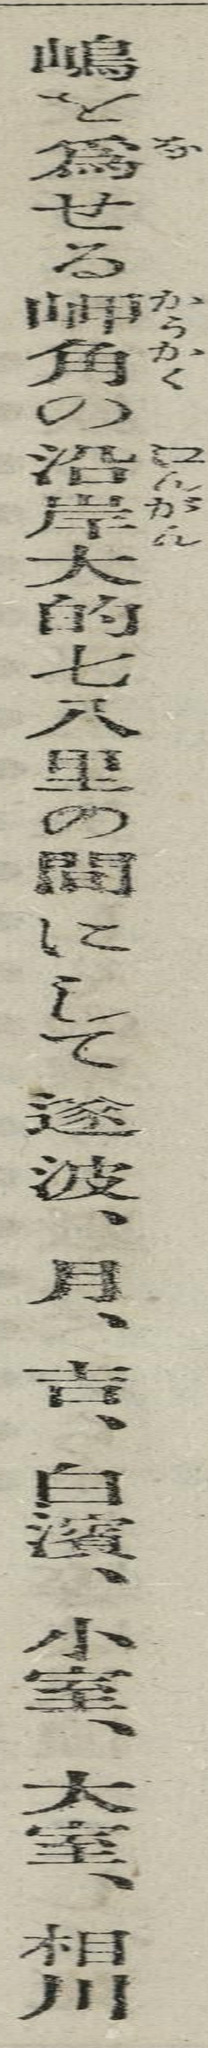嶋を爲せる岬角の沿岸大的七八里の間にして遂波、月、吉、白濱、小室、大室、相川
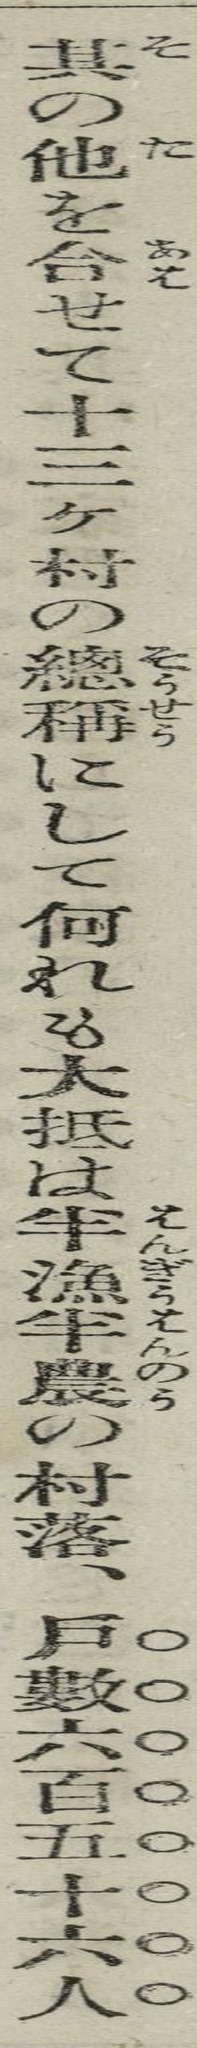其の他を合せて十三ケ村の總稱にして何れも大抵は半漁半農の村落、戸數六百五十六人
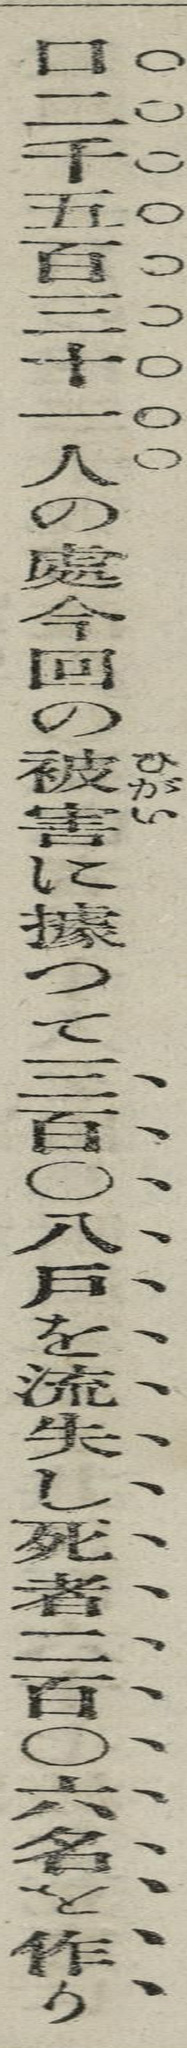口二千五百三十一人の處今回の被害に據つて三百○八戸を流失し死者二百○六名を作り
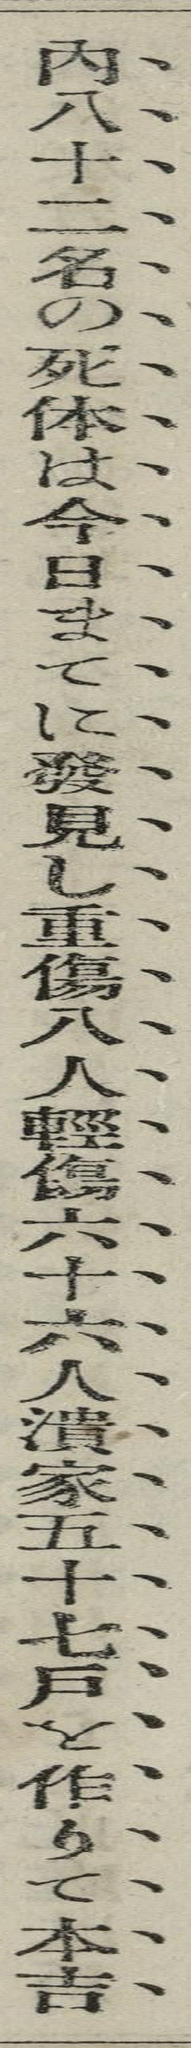内八十二名の死体は今日まてに發見し重傷八人輕傷六十六人潰家五十七戸と作りて本吉

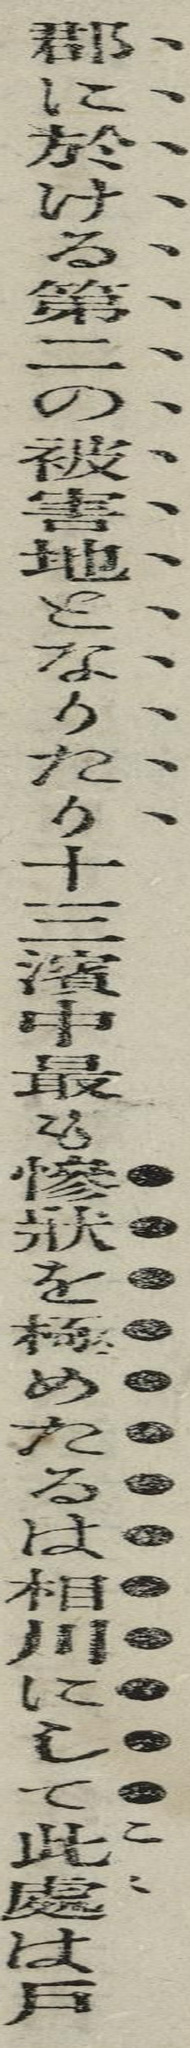郡に於ける第二の被害地となりたり十三濱中最も惨状を極めたるは相川にして此処は戸
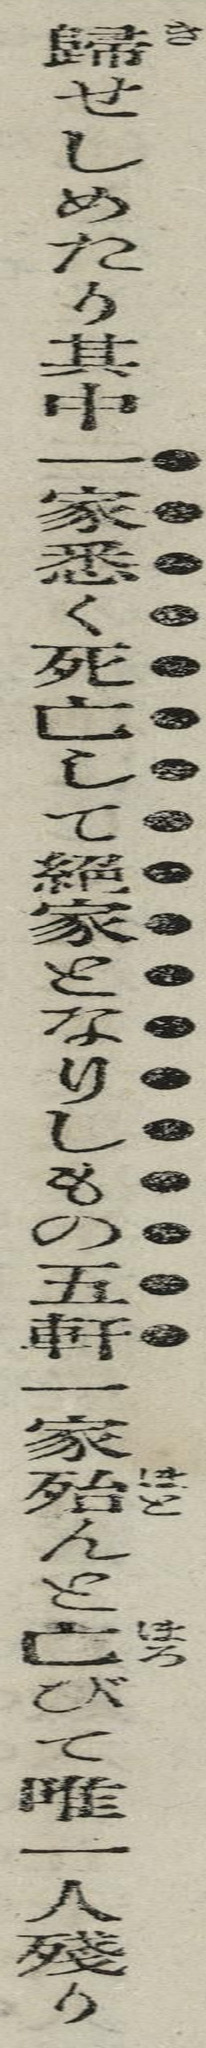帰せしめたり其中一家悉く死亡して絶家となりしもの五軒一家殆んと亡びて唯一人残り
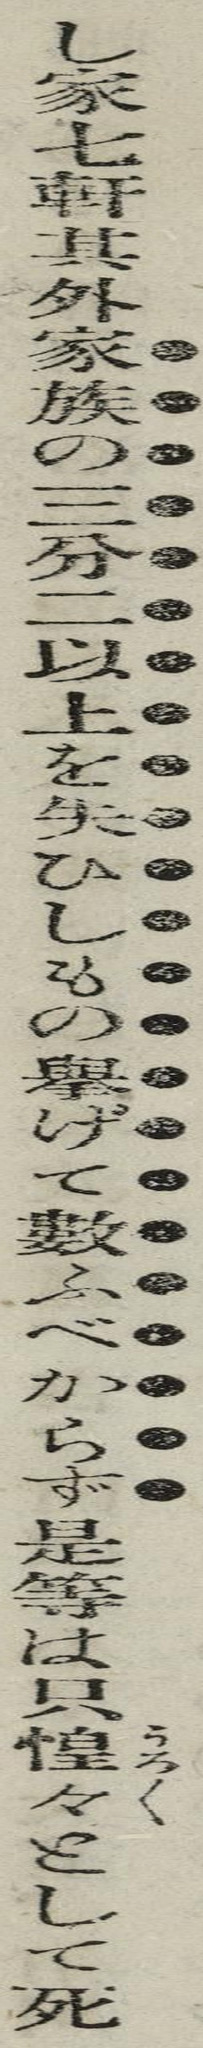し家七軒其外家族の三分二以上を失ひしもの挙げて数ふべからず是等は只惶々として死
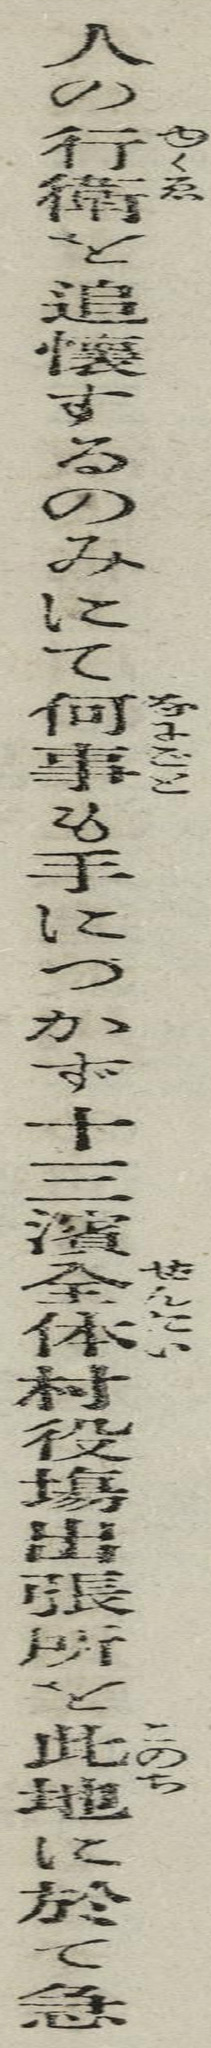人の行衛を追懐するのみにて何事も手につかず十三濱全体村役塲出張所を此地に於て急
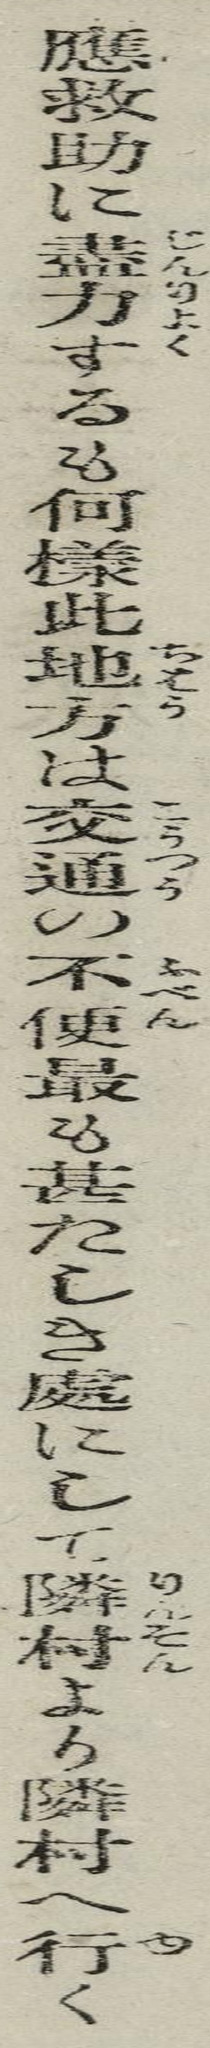應救助に尽力するも何様此地方は交通の不便最も甚たしき所にして隣村より隣村へ行く
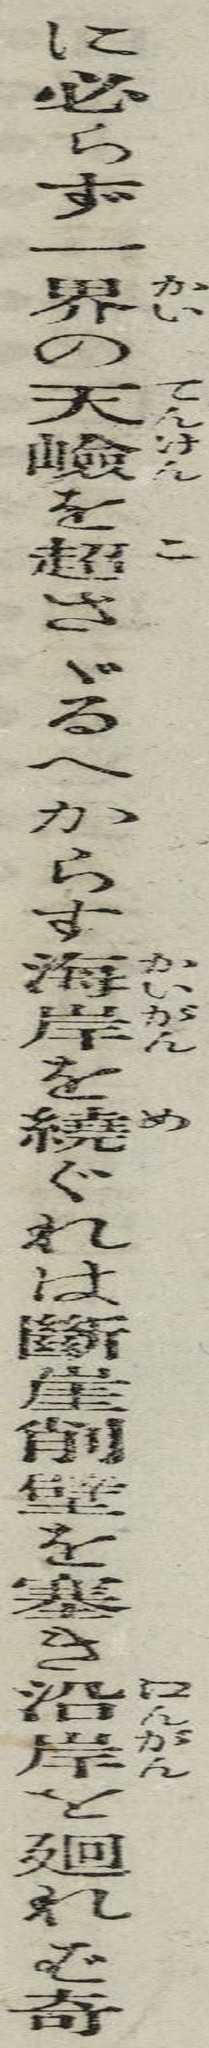に必らず一界の天嶮を超さゞるへからす海岸を繞ぐれは断崖削壁を塞き沿岸を廻れば奇
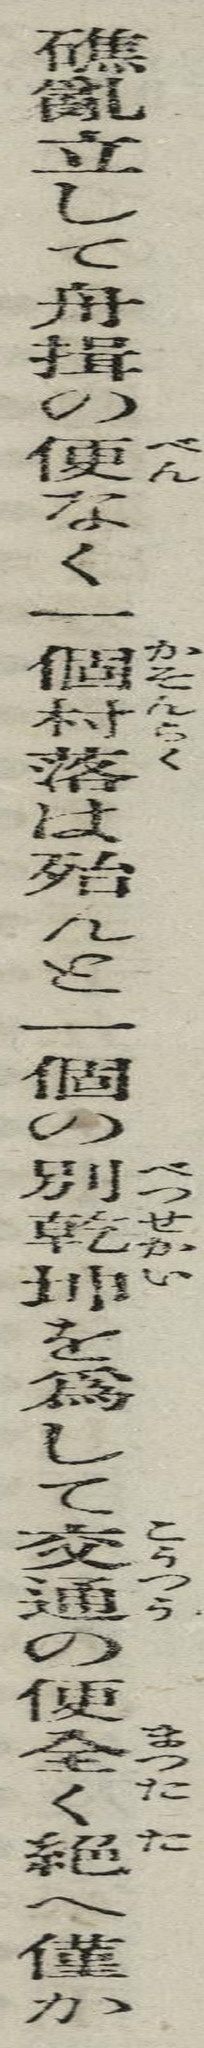礁乱立して船揖の便なく一個村落は殆んと一個の別乾坤を為して交通の便全く絶へ僅か
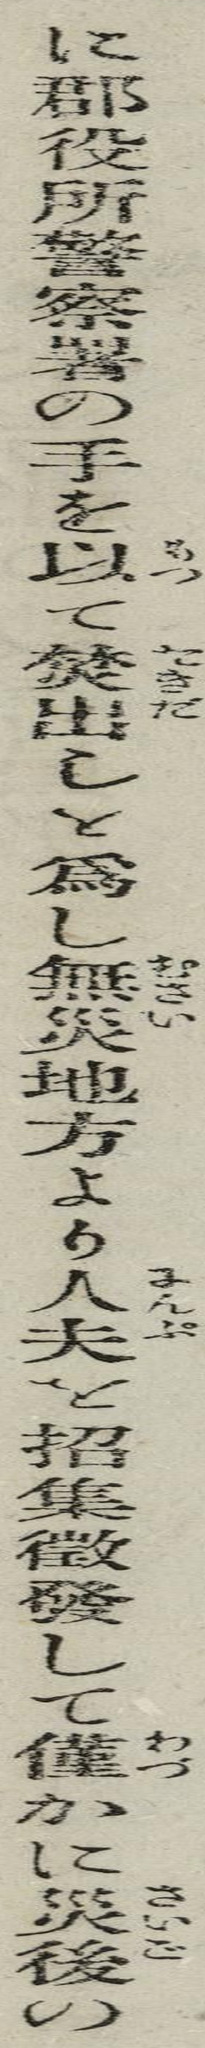に郡役所警察署の手を以て焚出しと為し無災地方より人夫を招集挑発して僅かに災後の
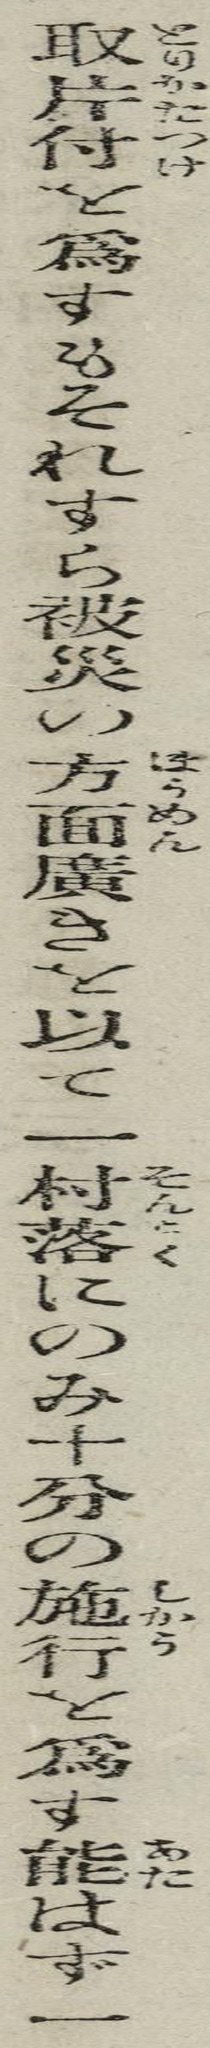取片付を為すもそれすら被災の方面廣きを以て一村落にのみ十分の施行を為す能はず一
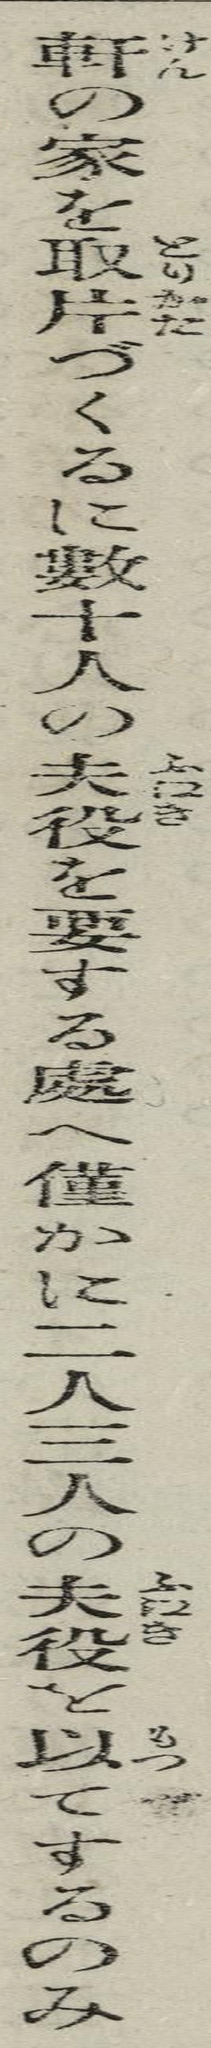軒の家を取片づくるに数十人の夫役を要する処へ僅かに二人三人の夫役を以てするのみ
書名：三陸海嘯細見
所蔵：東京大学地震研究所図書室 Earthquake Research Institute Library, The University of Tokyo, JAPAN
